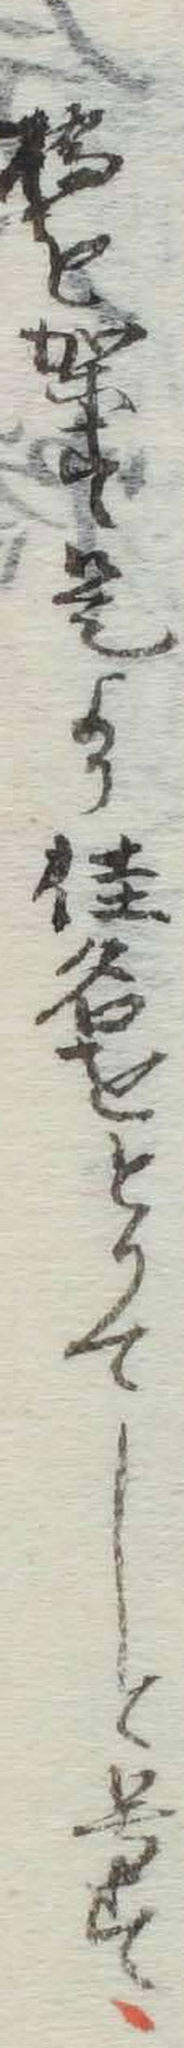橋を架す是より佳名をとりて――と号す、
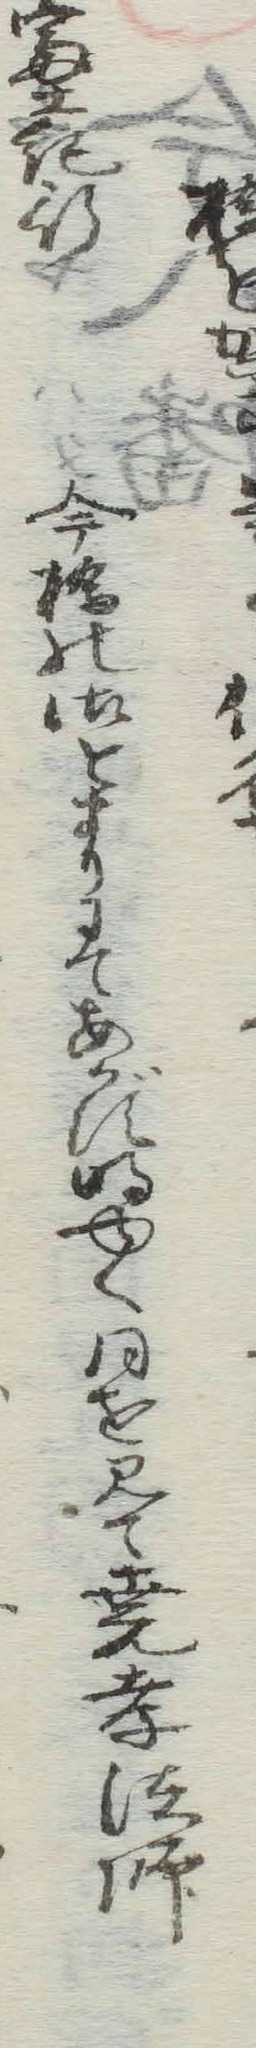●富士紀行今橋の御とまりにてあかず明ゆく月を見て尭孝法師
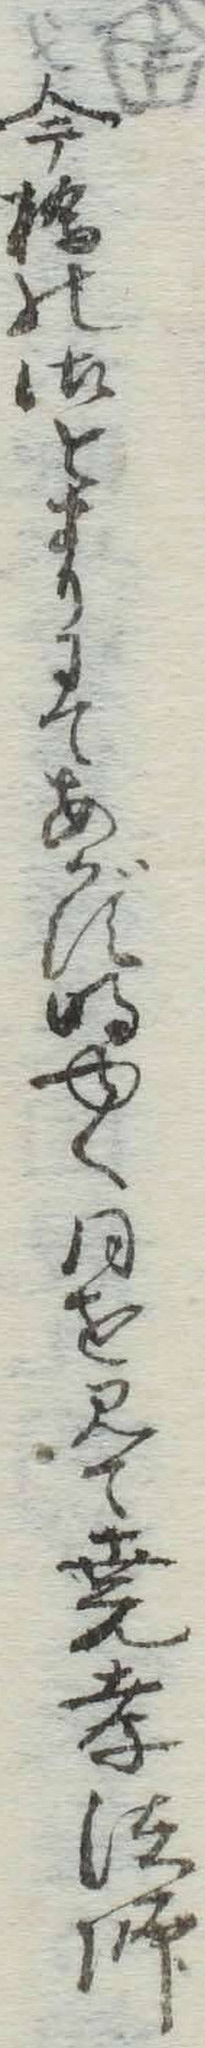●富士紀行今橋の御とまりにてあかず明ゆく月を見て尭孝法師
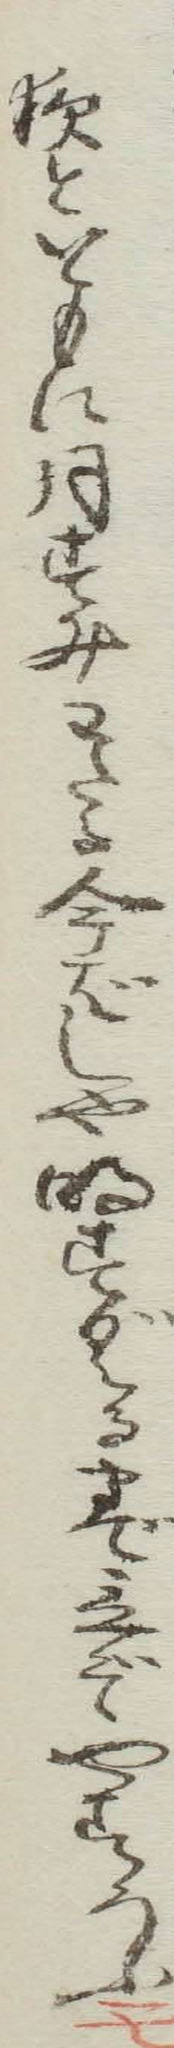夜とともに月すみわたる今ばしや明すぐるまで立ぞやすらふモ
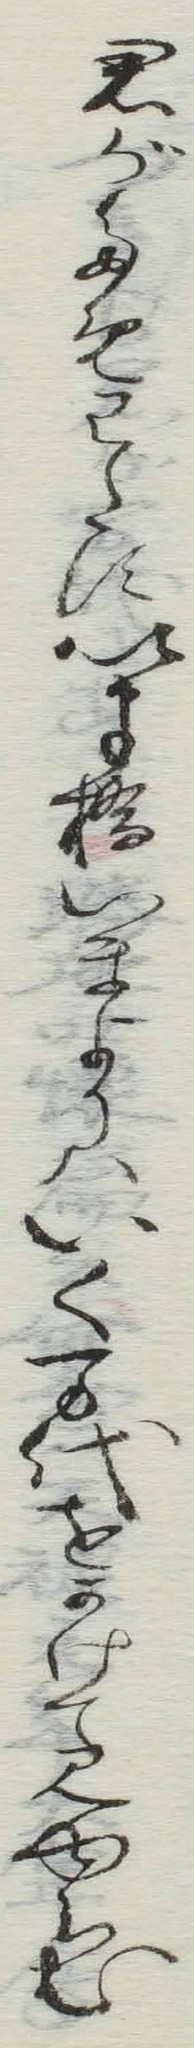君がためわたすいま橋いまよりはいく万代をかけて見ゆらむ
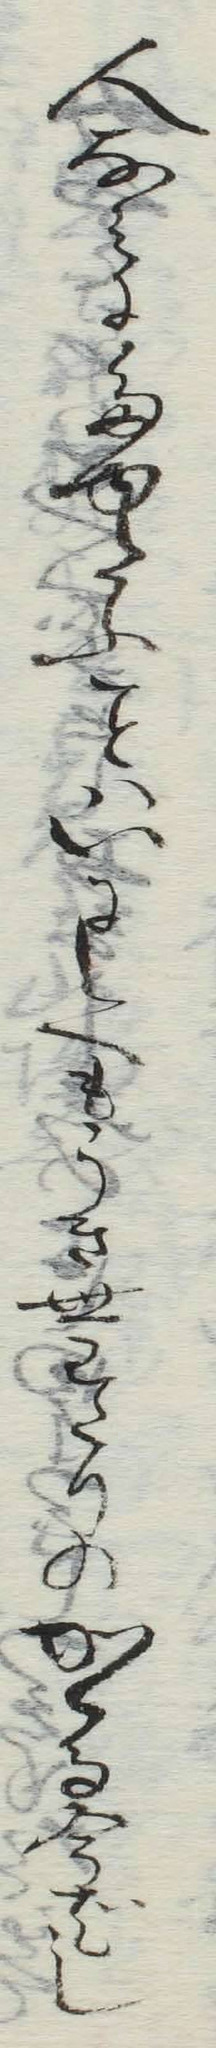人なみにたゆたふことはいにしへもうき世わたりのかくる今ばし
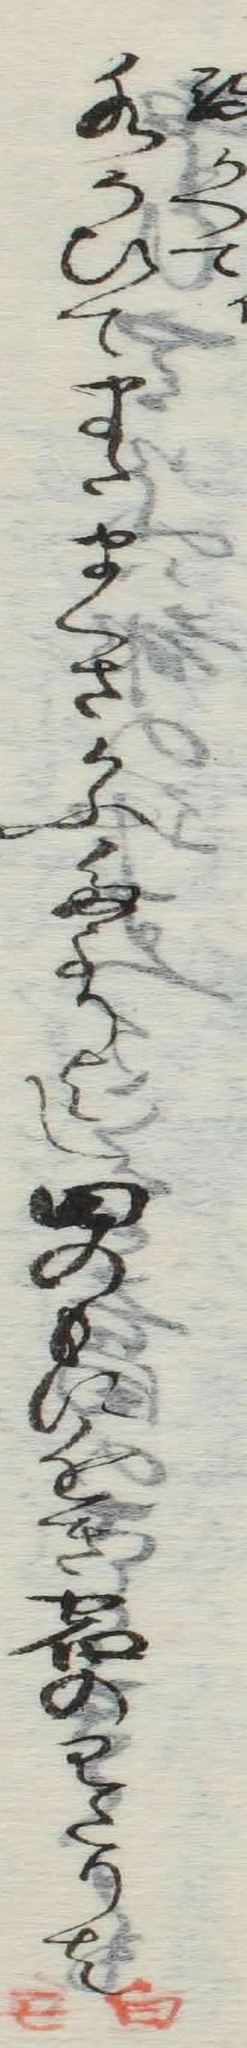水かひてまたまくさかふたよりよし田のもに近き宿のわたりは白モ
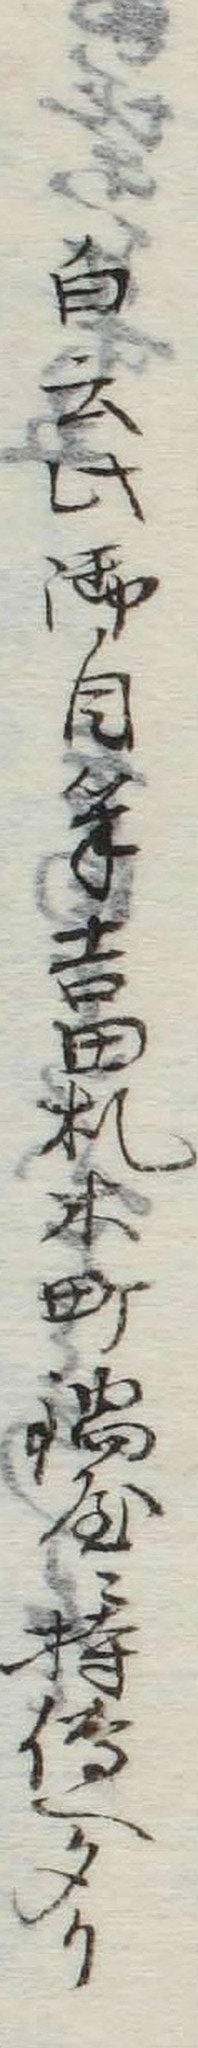白云此御自筆吉田札木町鍋屋ニ持伝ヘタリ
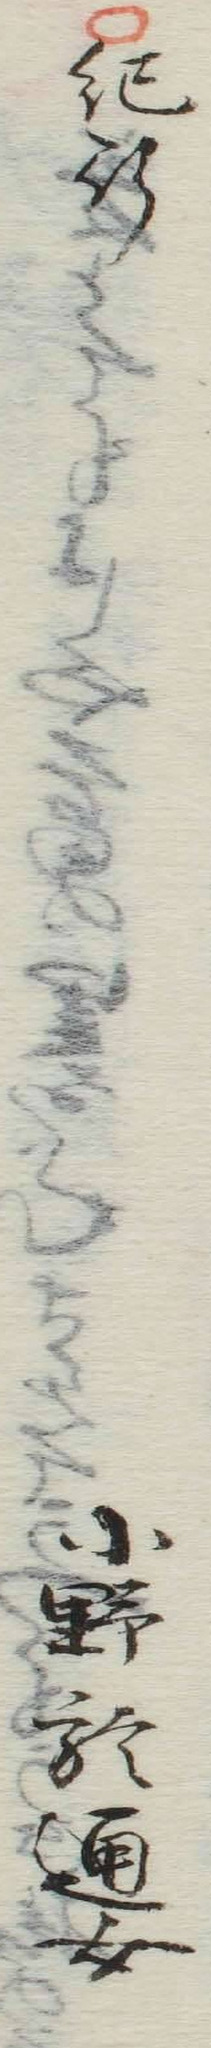○紀行小野於通女
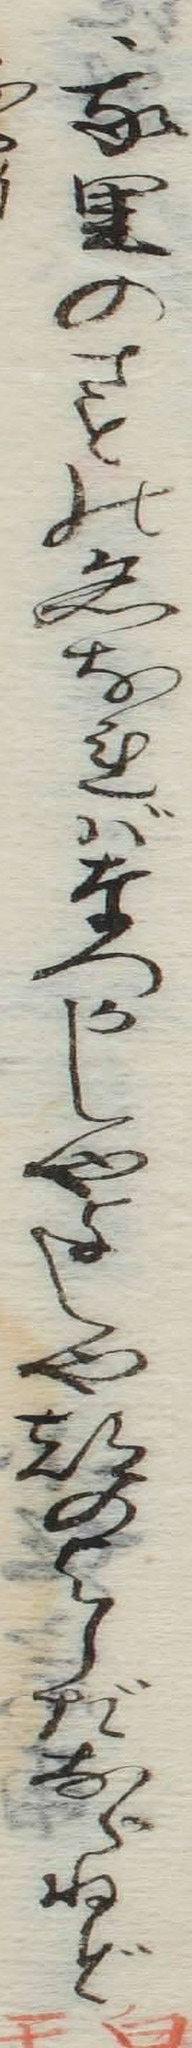我里のさとの名なればなつかしやよしや都のよしだならねど白モ
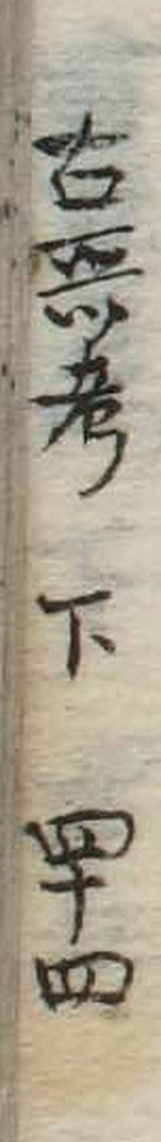古歌考下四十四

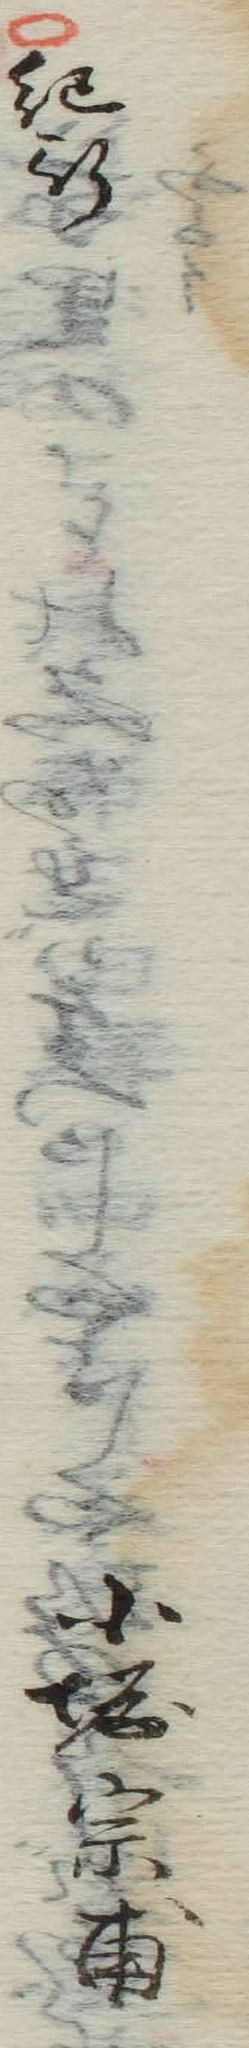○紀行小堀宗甫
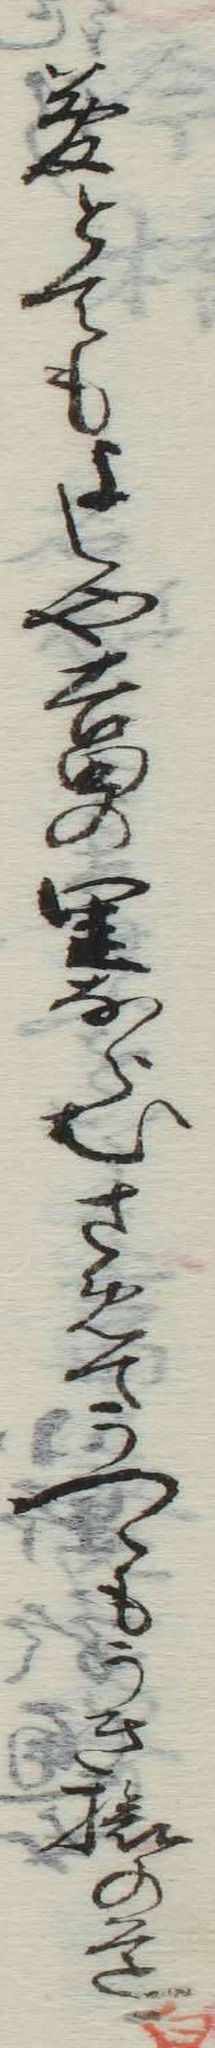夢とてもよしや吉田の里ならむさめてうつゝもうき旅の道白
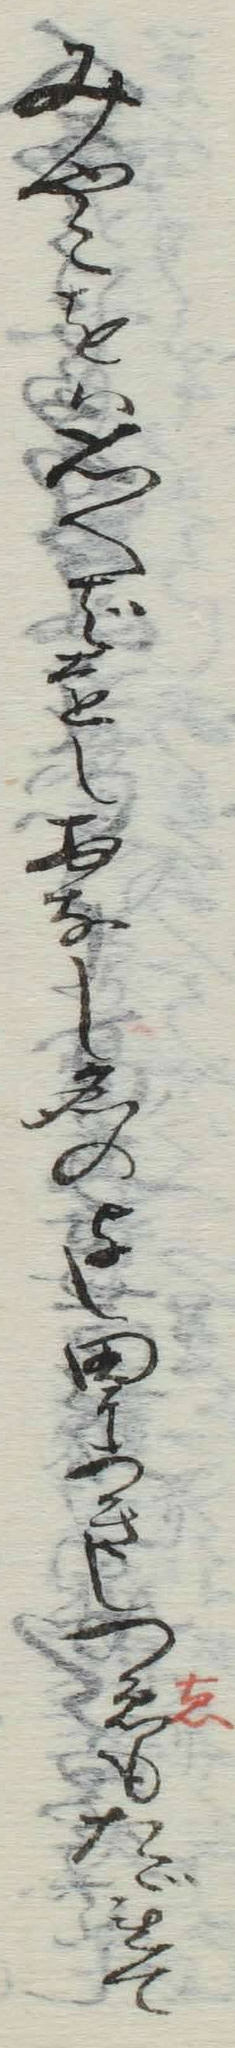みやこをは思へば遠しおなし名のよし田につきしつゑもたゞれて
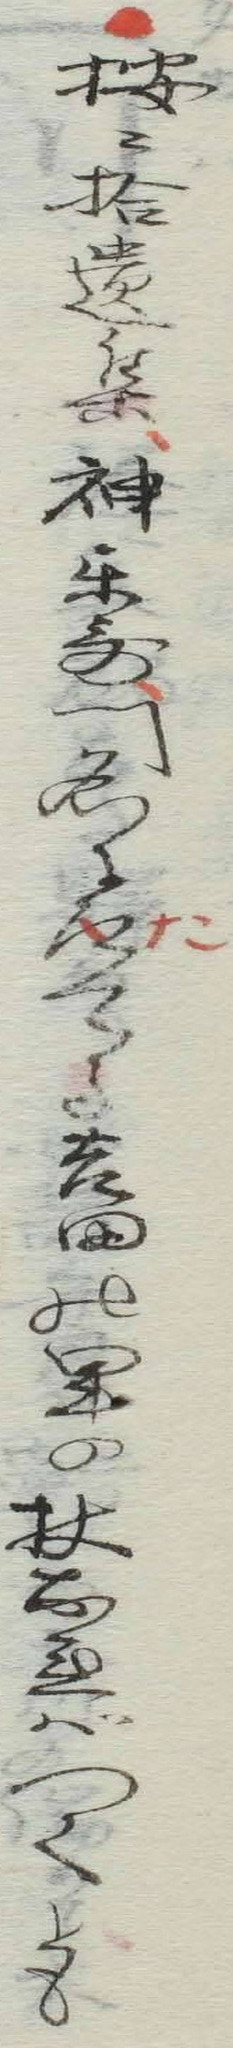●按ニ拾遺集、神楽歌、〽名にたてる吉田の里の杖なればつくとも
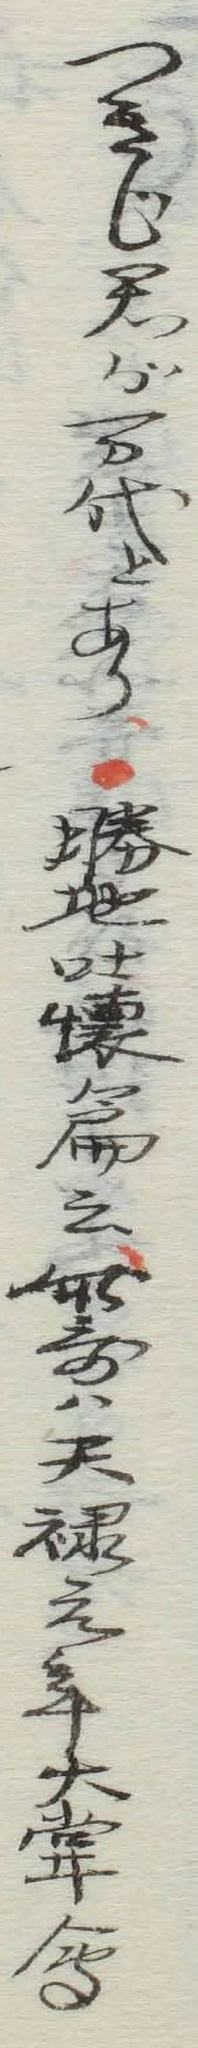つきじ君が万代とあり、●勝地吐懐篇云、此歌は天禄元年大嘗會
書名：三河国古跡考
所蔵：国文学研究資料館
